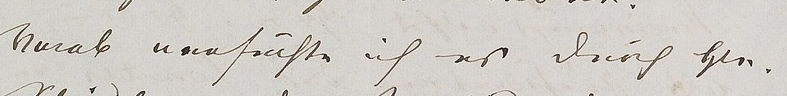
Vorab versuchte ich es durch Hrn.
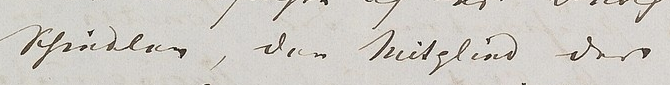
Schindler, der Mitglied des
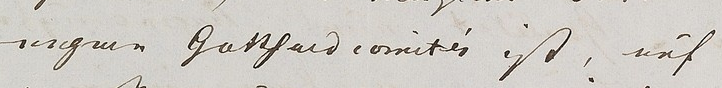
engern Gotthard comités ist, auf
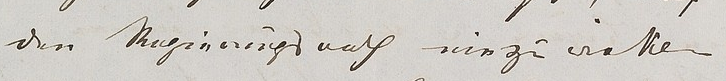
den Regierungsrath einzuwirken
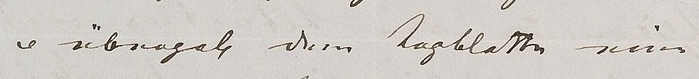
& übergab dem Tagblatte eine
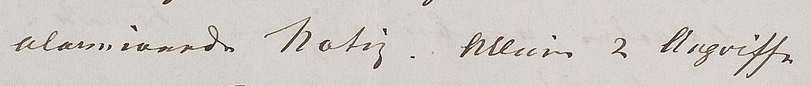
alarmirende Notiz. Allein 2 Angriffe
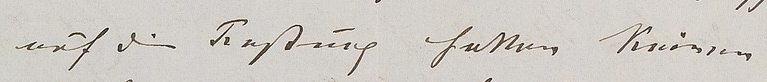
auf die Festung hatten keinen
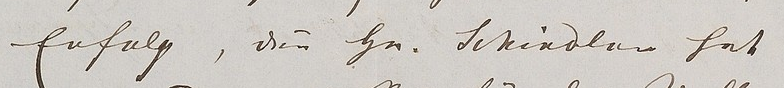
Erfolg, denn Hr. Schindler hat
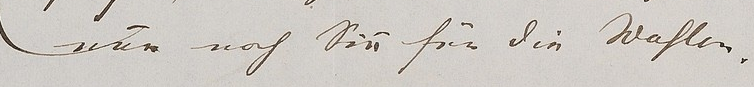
nur noch Sinn für die Wahlen.
